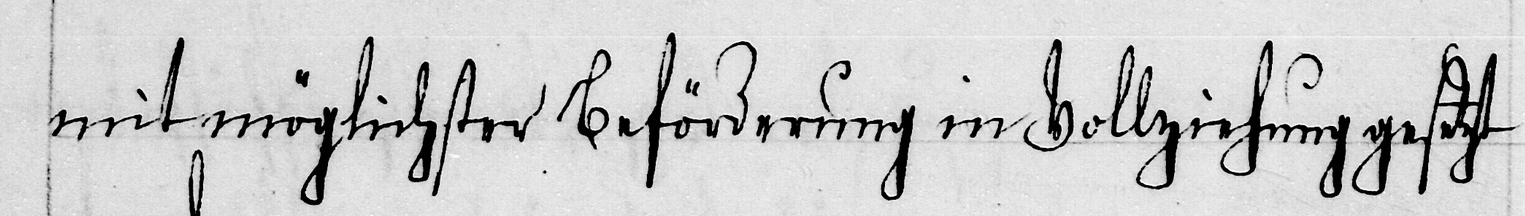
mit möglichster Beförderung in Vollziehung geset¬
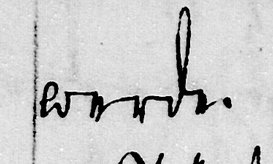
werde.
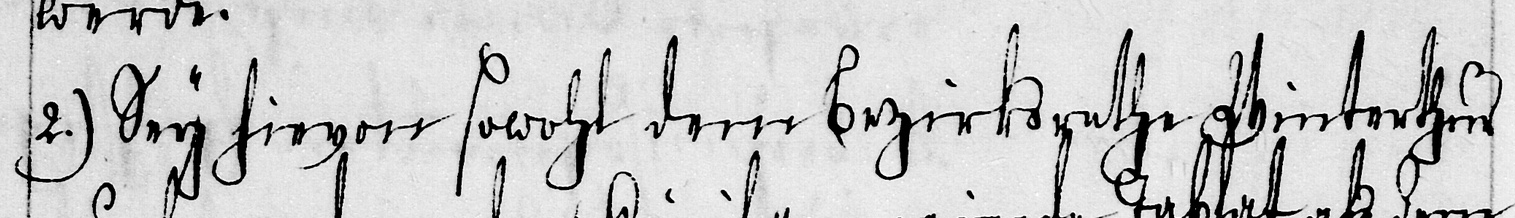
2.) Sey hievon sowohl dem Bezirksrathe Winterthur
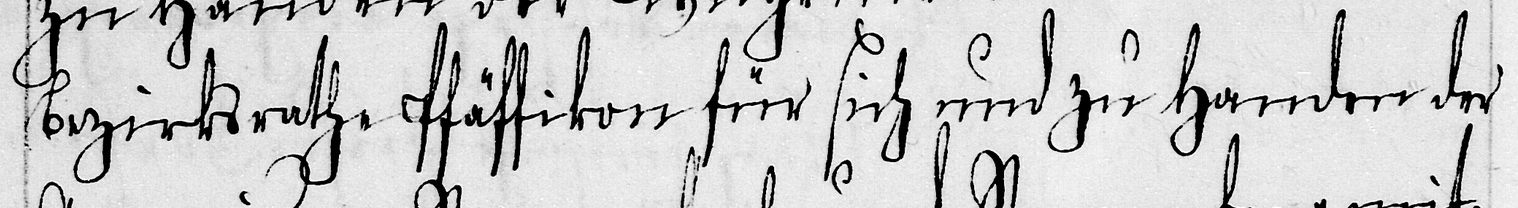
Bezirksrathe Pfäffikon für sich und zu Handen der
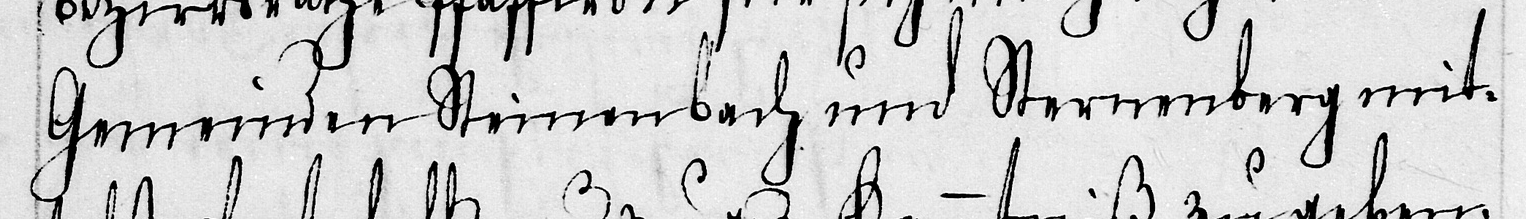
Gemeinden Steinenbach und Sternenberg mit¬
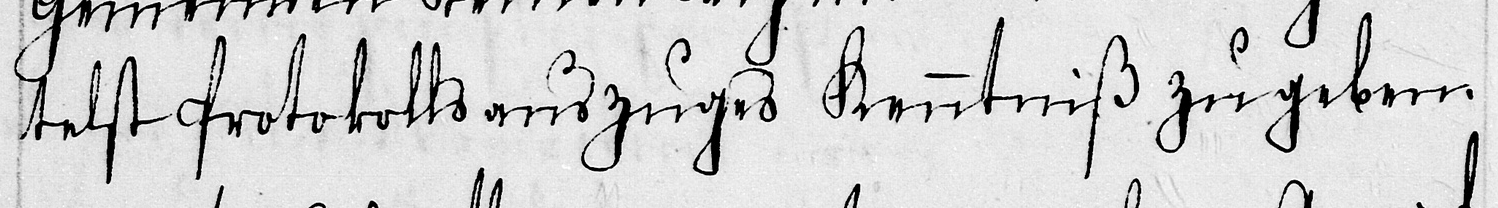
telst Protokollsauszuges Kenntniß zu geben.
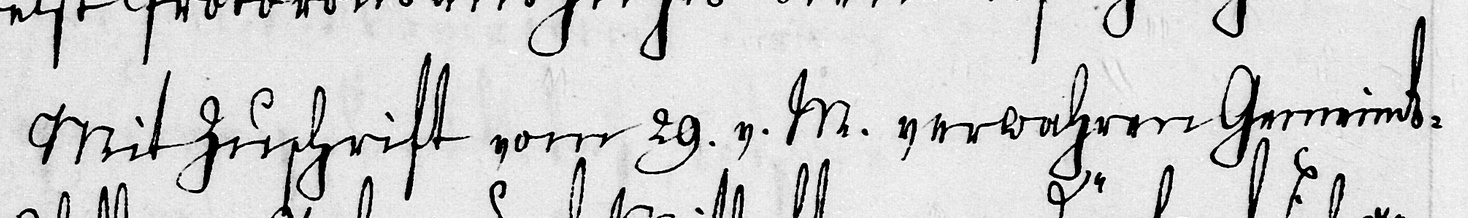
Mit Zuschrift vom 29. v. M. verwahren Gemeinds¬
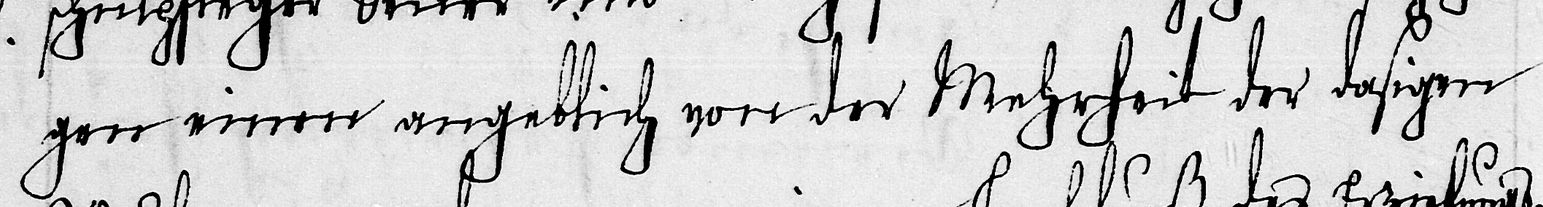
gen einen angeblich von der Mehrheit der dasigen
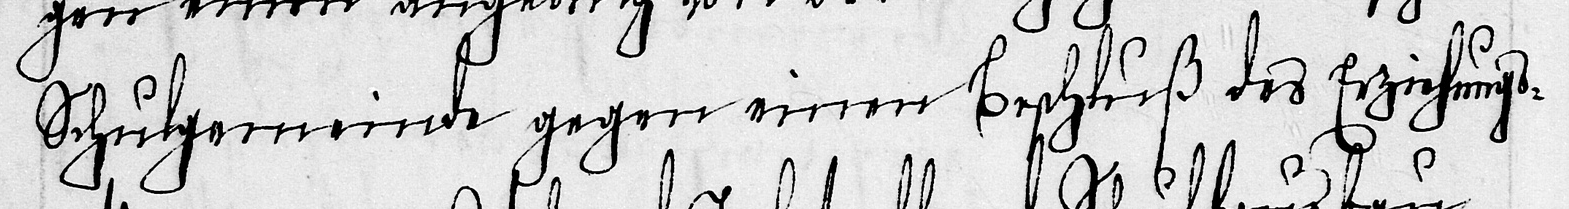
Schulgemeinde gegen einen Beschluß des Erziehungs¬
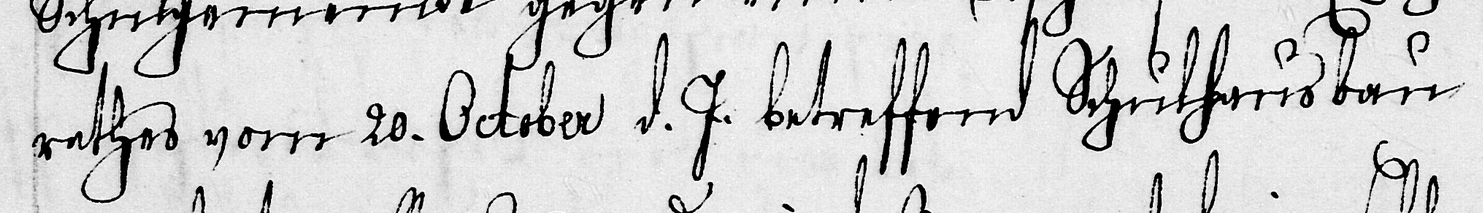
rathes vom 20. October d. J. betreffend Schulhausbau
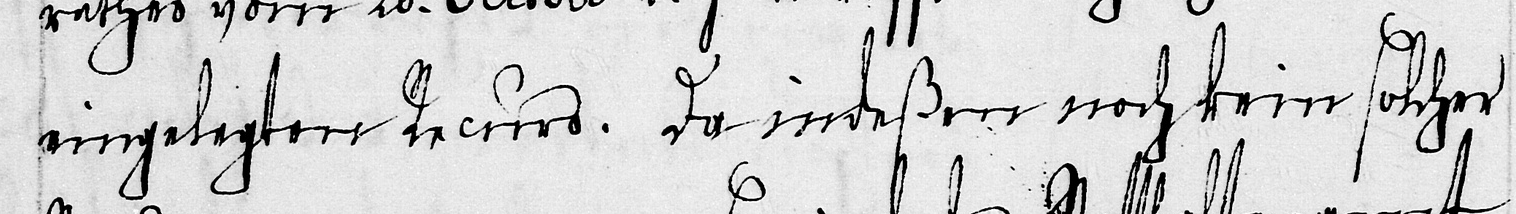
eingelegten Recurs. Da indeßen noch kein solcher
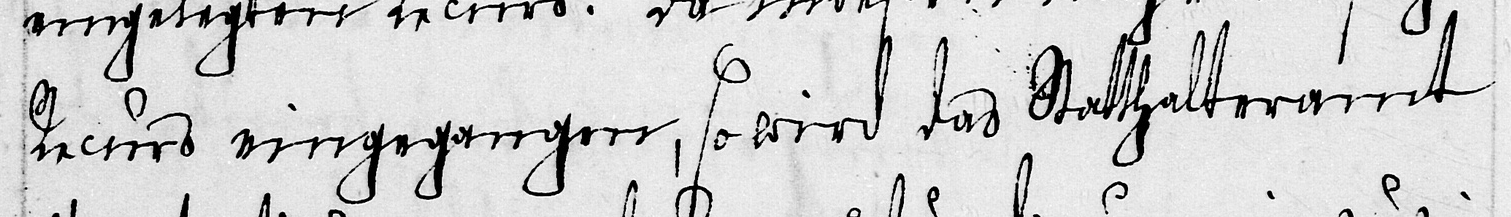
Recurs eingegangen, so wird das Statthalteramt
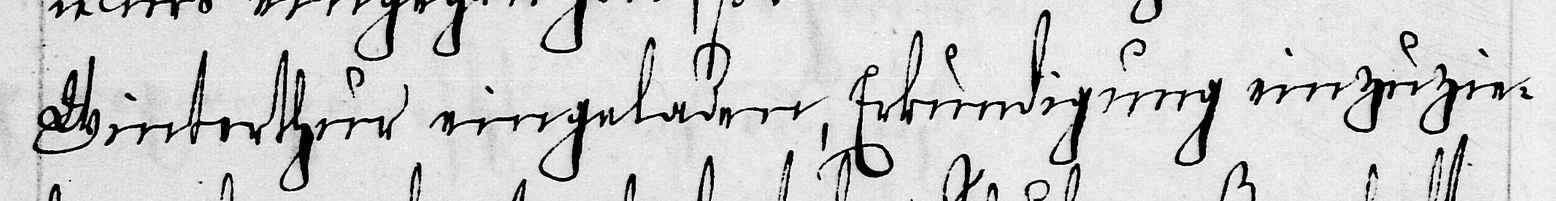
Winterthur eingeladen, Erkundigung einzuzie¬
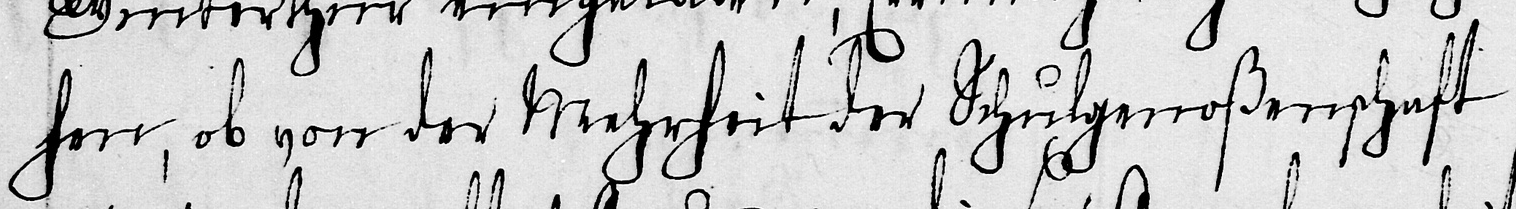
hen, ob von der Mehrheit der Schulgenoßenschaft
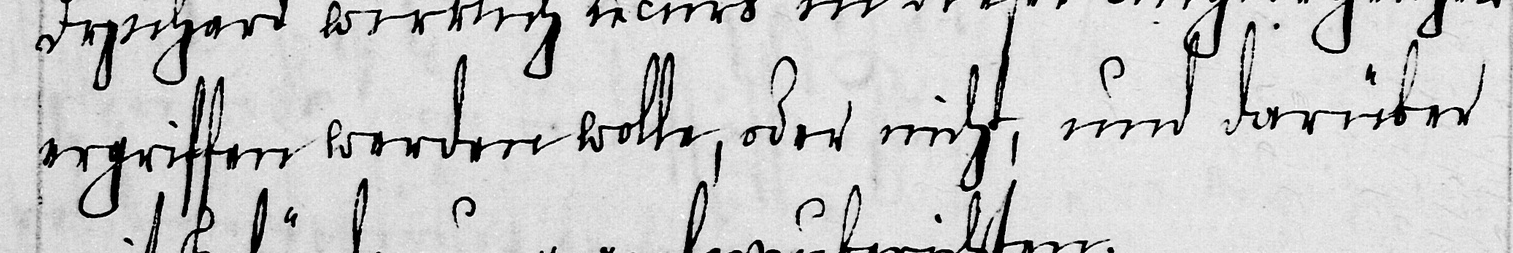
ergriffen werden wolle, oder nicht, und darüber
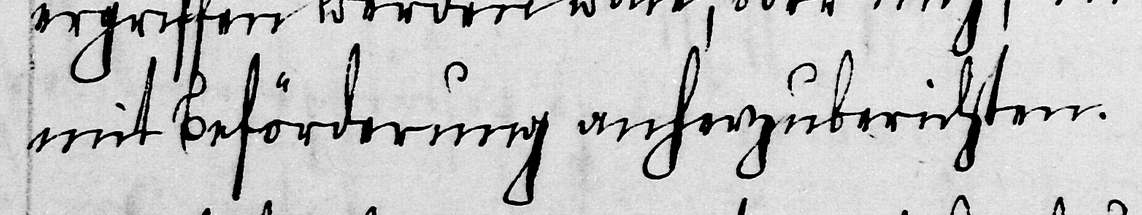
mit Beförderung anherzuberichten.
